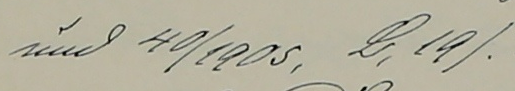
und 40/1905, L.19)
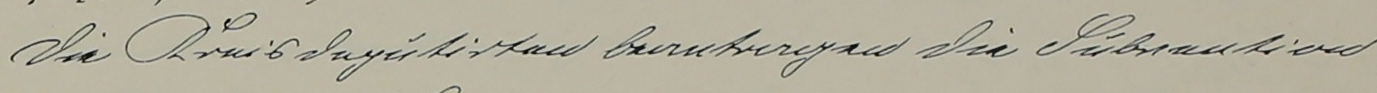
Die Kreisdeputirten beantragen, die Subvention
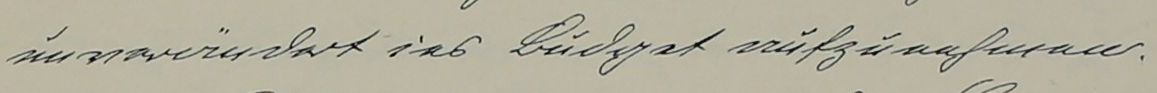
unverändert ins Budget aufzunehmen.
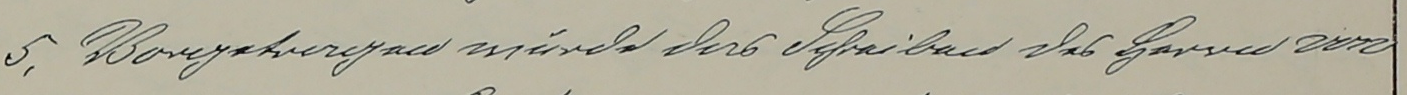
5. Vorgetragen wurde das Schreiben des Herrn von
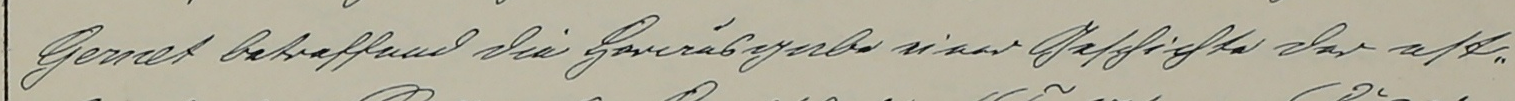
Gernet betreffend die Herausgabe einer Geschichte der est-
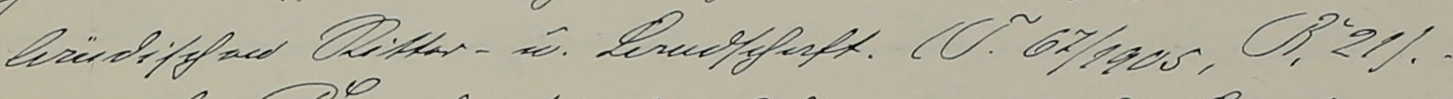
ländischen Ritter- u. Landschaft. (T. 67/1905, R.21).
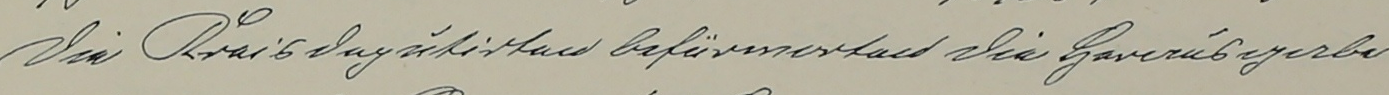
Die Kreisdeputirten befürworten die Herausgabe
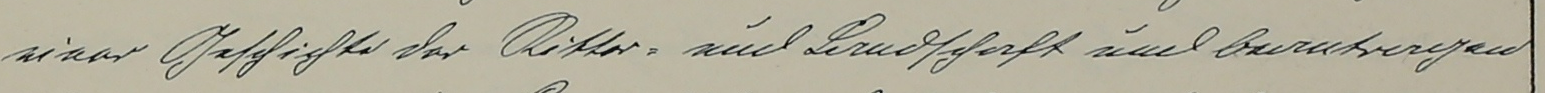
einer Geschichte der Ritter- und Landschaft und beantragen
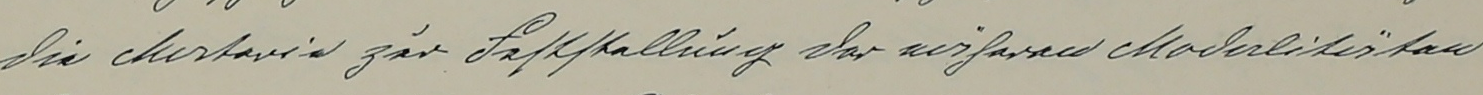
die Materie zur Feststellung der näheren Modalitäten
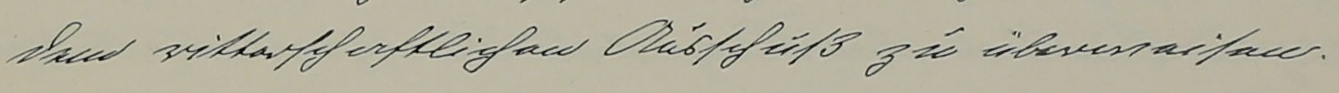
dem ritterschaftlichen Ausschuß zu überweisen.
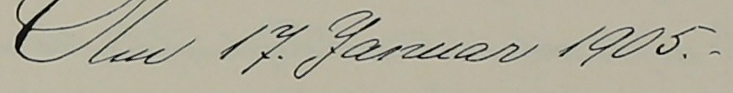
Am 17. Januar 1905.
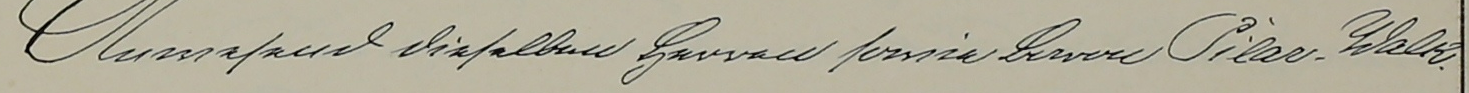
Anwesend dieselben Herren sowie Baron Pilar-Walk.
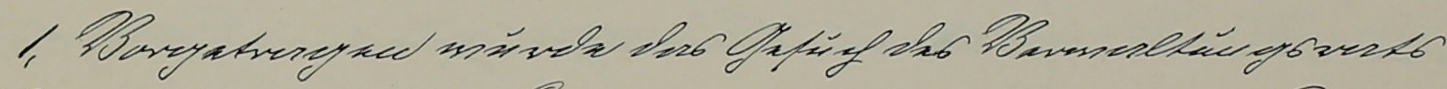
1. Vorgetragen wurde das Gesuch des Verwaltungsrats
